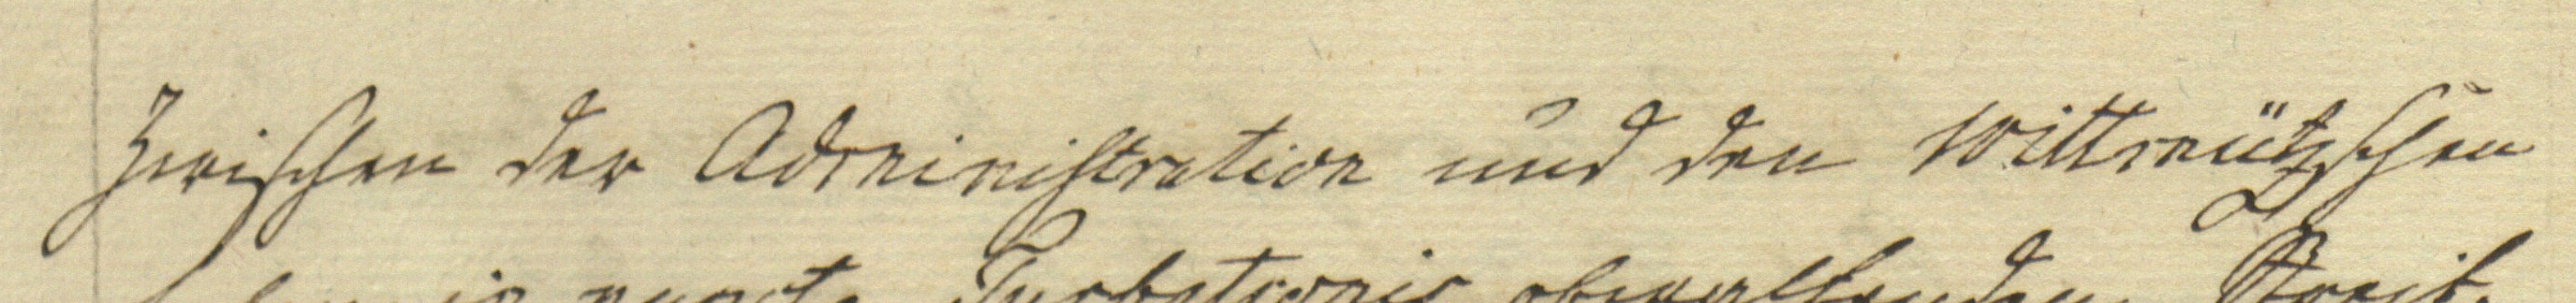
zwischen der Administration und dem Wittmützschen
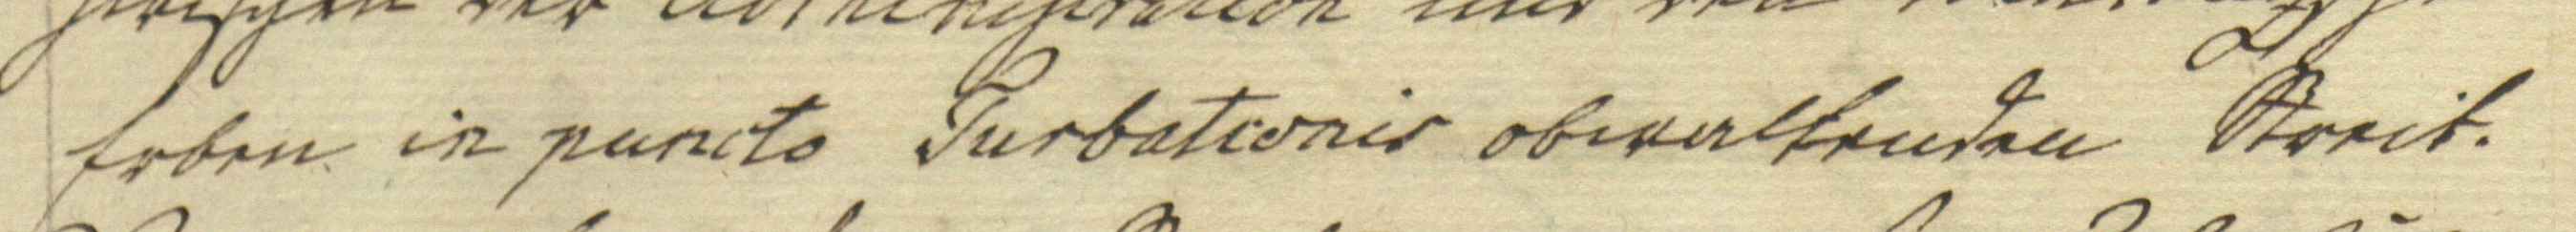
Erben in puncto Turbationis obwaltenden Streit¬
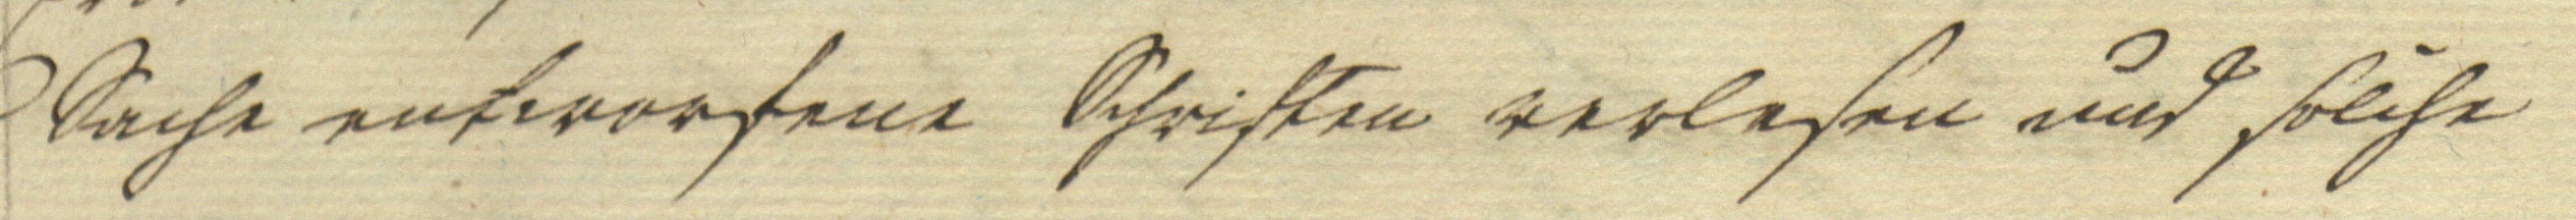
Sache entworfene Schriften verlesen und solche
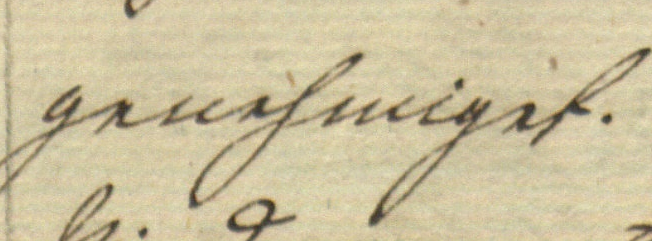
genehmiget.
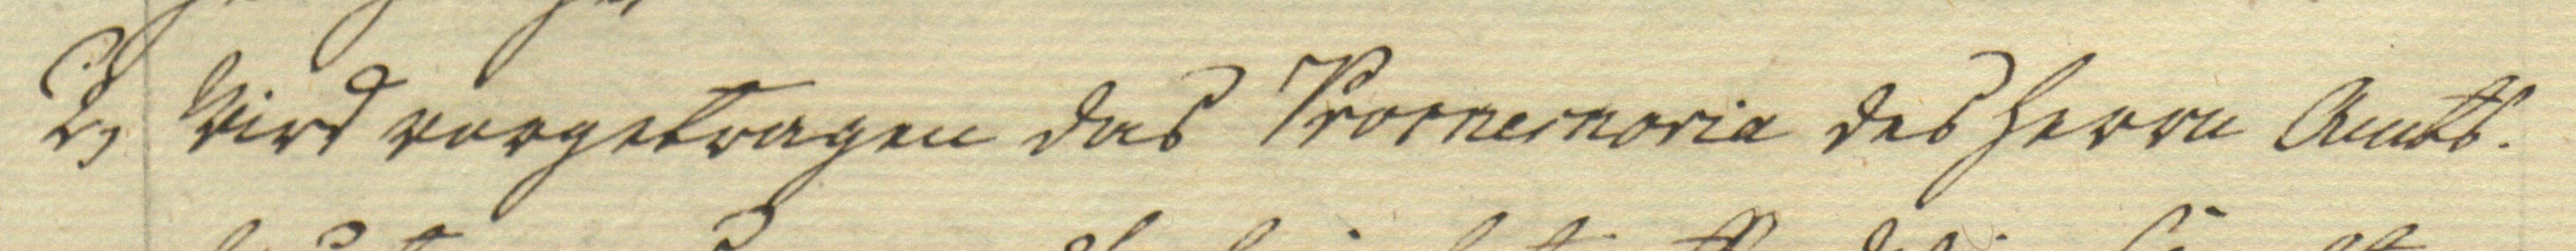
2. Wird vorgetragen das Promemoria des Herrn Amts¬
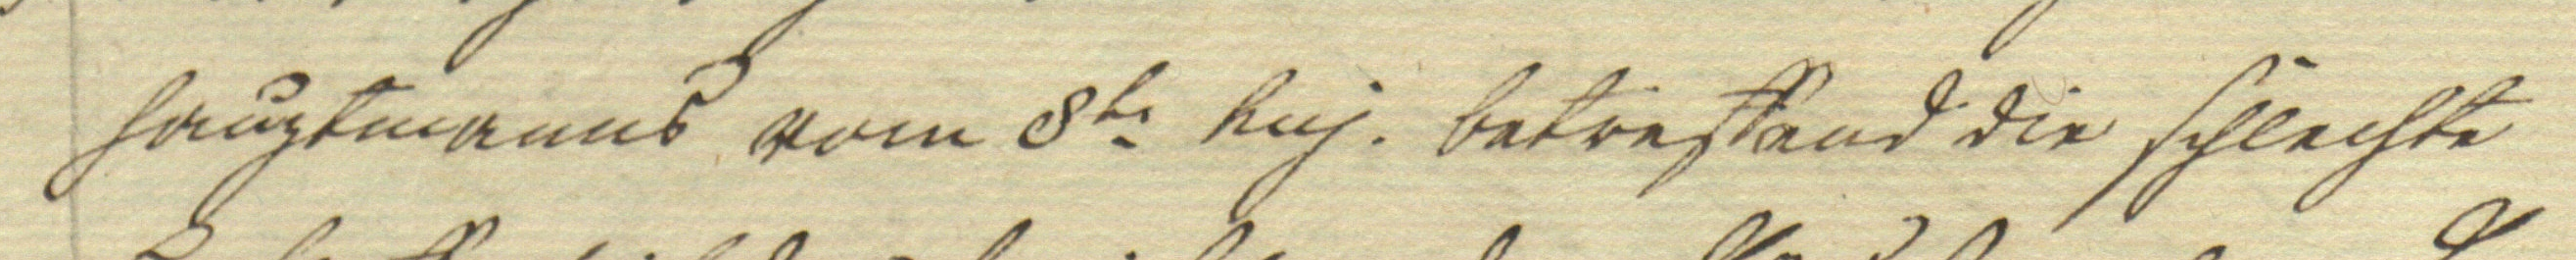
hauptmanns vom 8 te huj. betreffend die schlechte
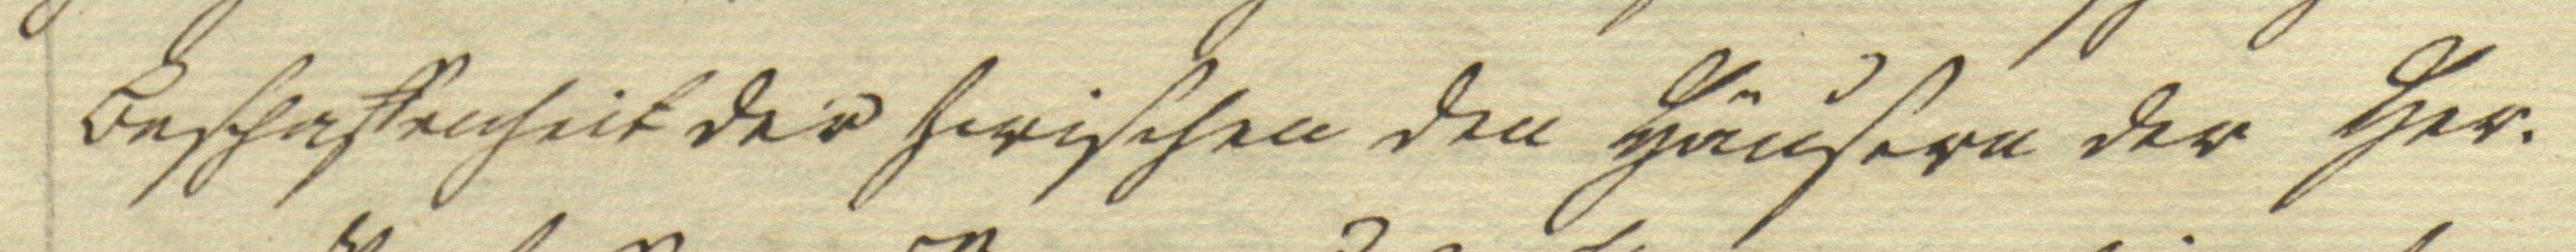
Beschaffenheit der zwischen den Häusern der Her¬
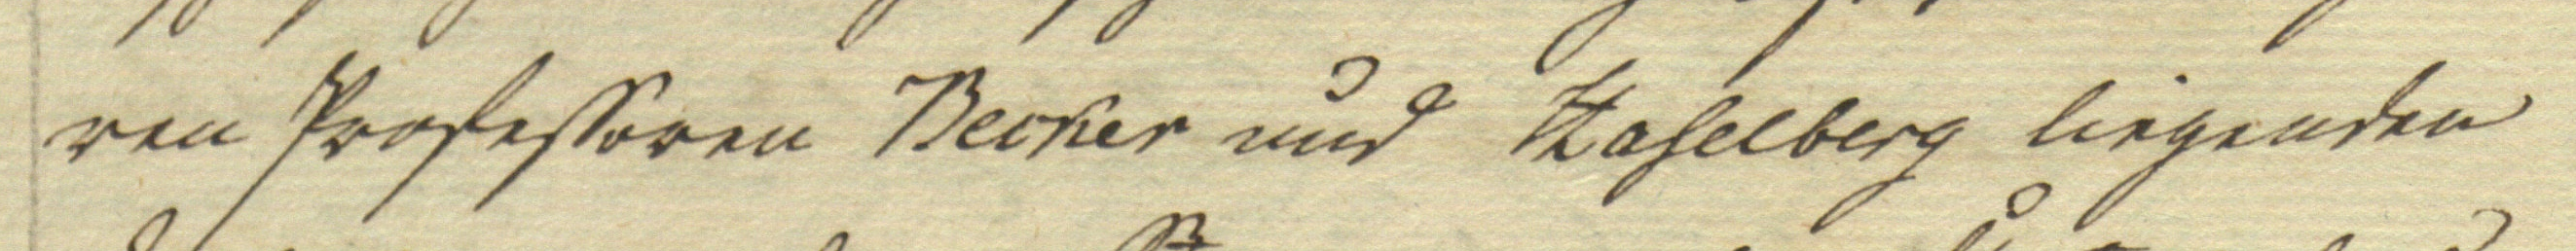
ren Professoren Becker und Haselberg liegenden
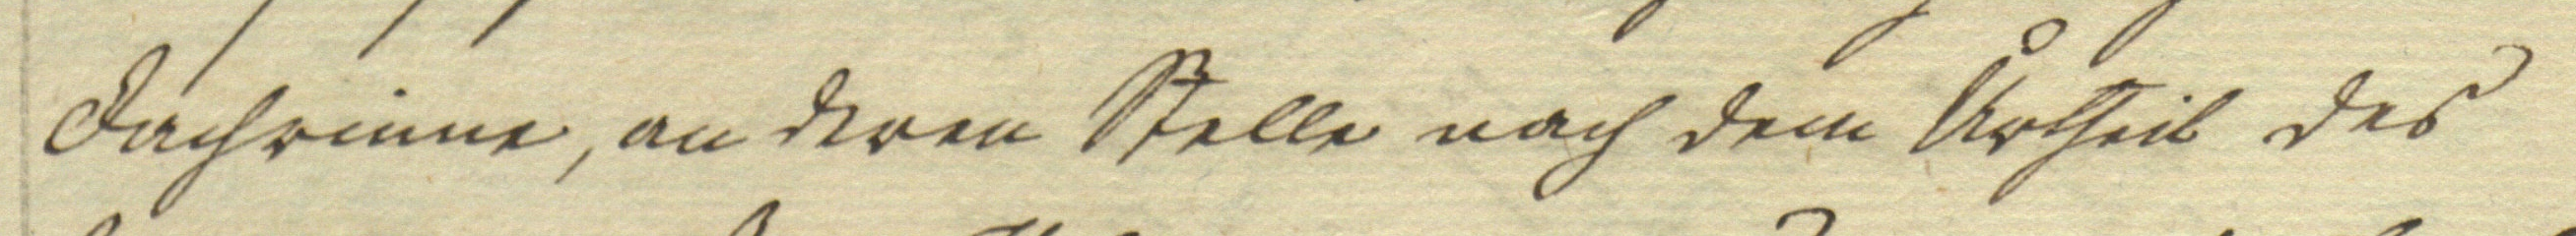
Dachrinne, an deren Stelle nach dem Urtheil des
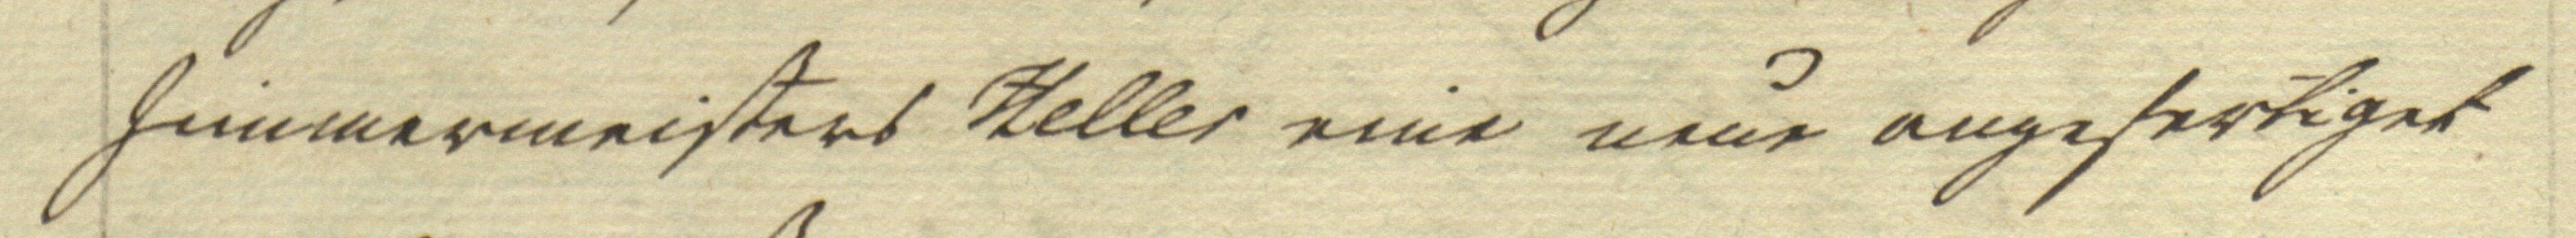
Zimmermeisters Heller eine neue angefertiget
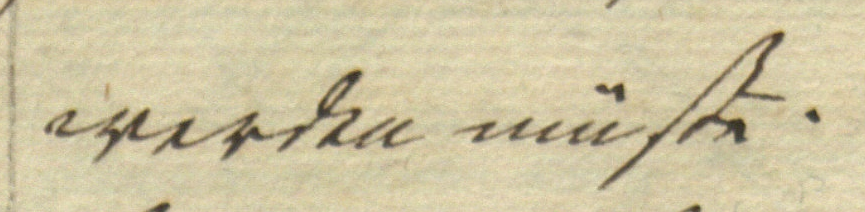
werden müßte.
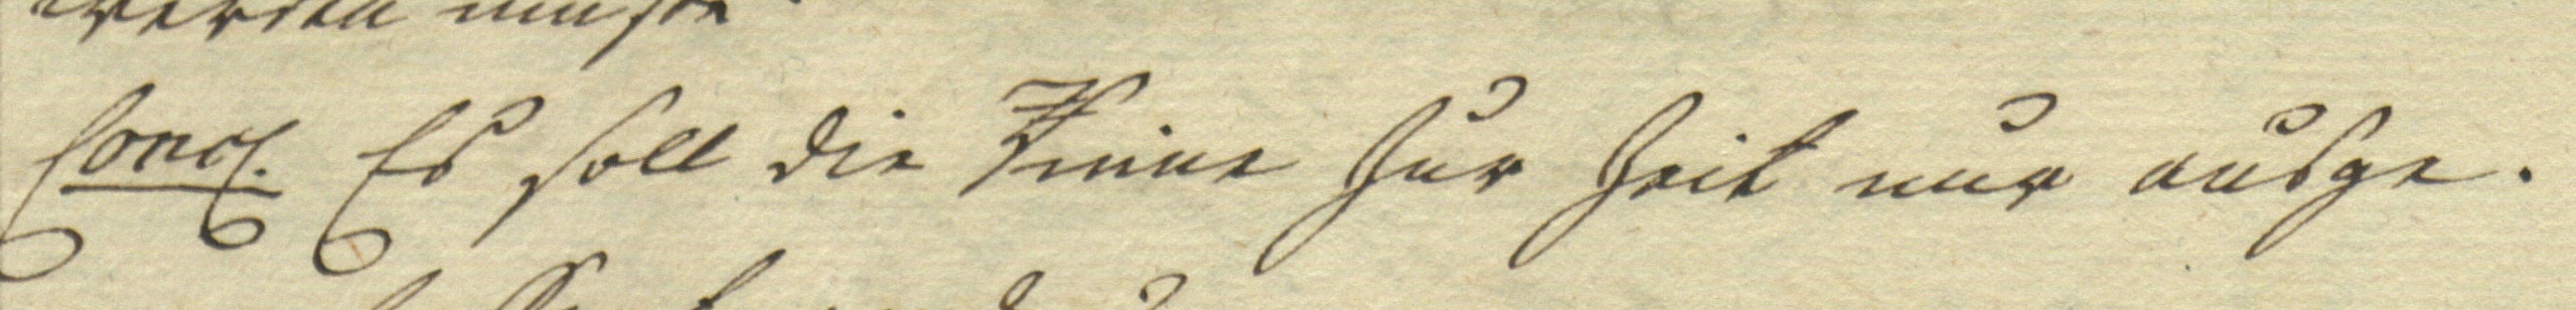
Concl. Es soll die Rinne zur Zeit nur ausge¬
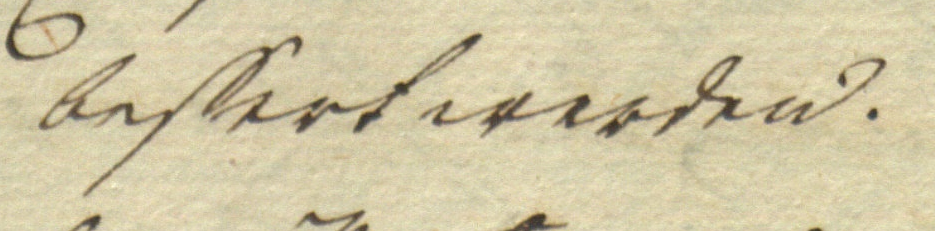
bessert werden.
